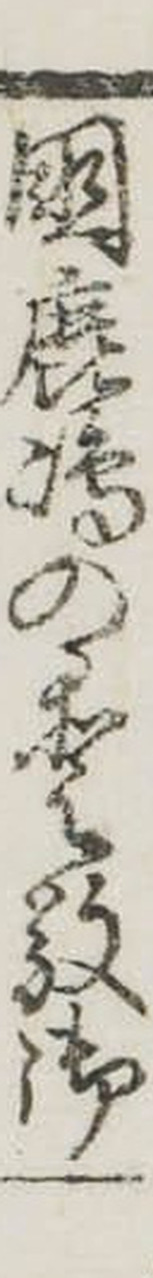国鹿嶋の愛敬御
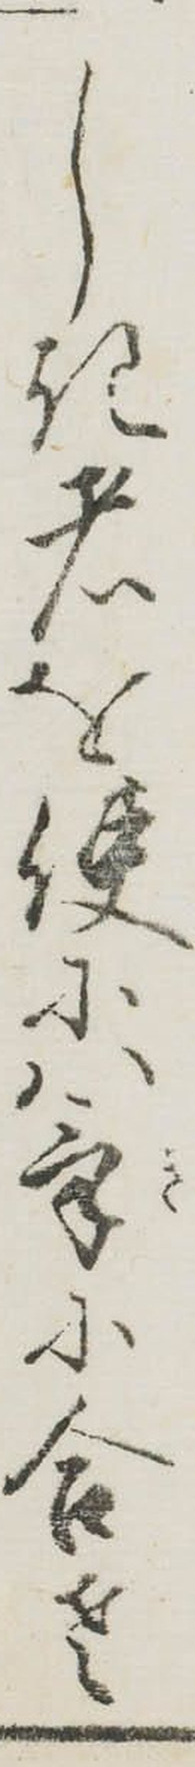しき者を使には気に合せ
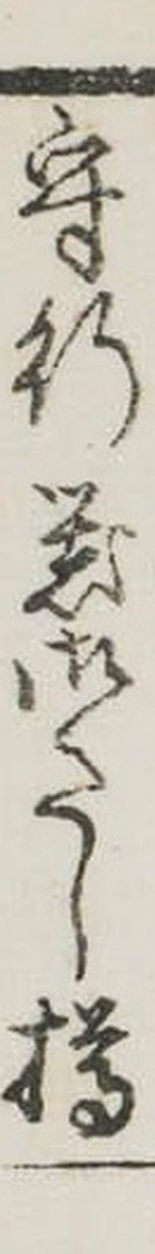守行器御さし樽
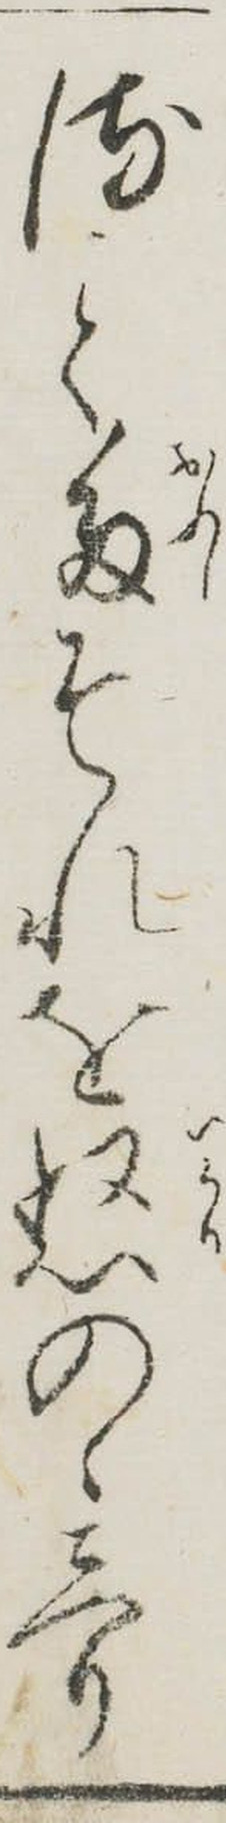ること多それを怒のゝしり
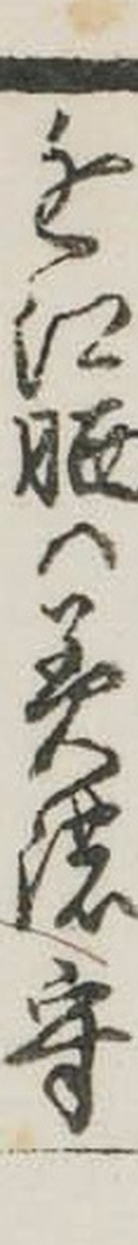近江晒は美濃守
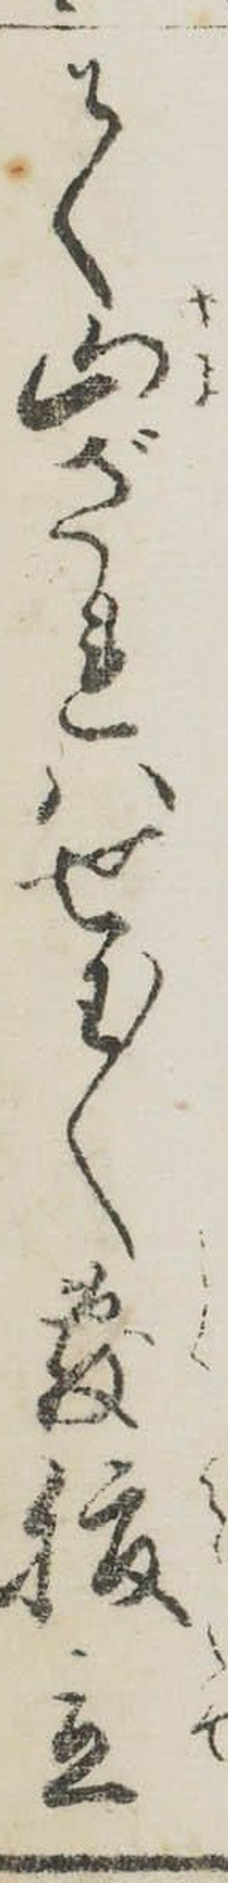て止ざれはせわ〳〵敷腹立

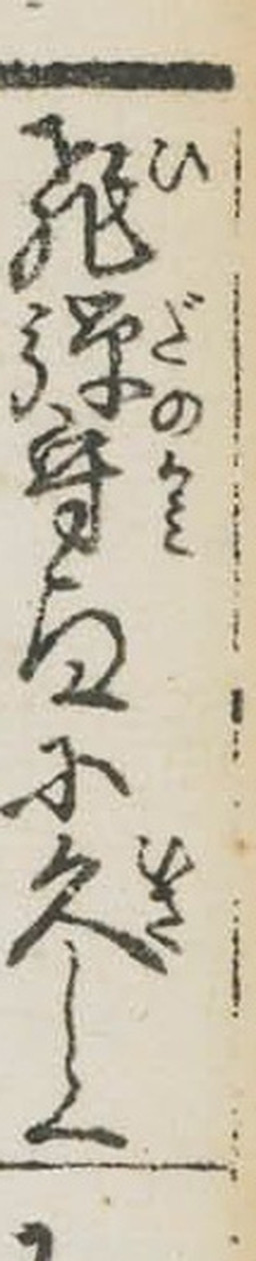飛騨守さまに久しく
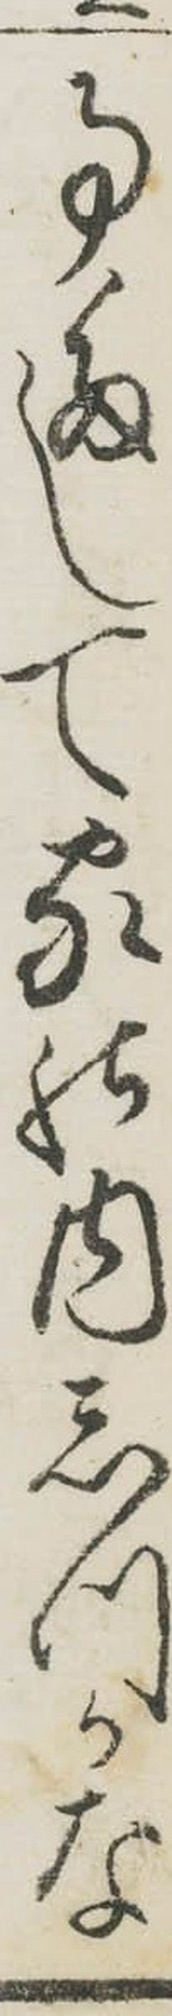事まして家の内しつかな
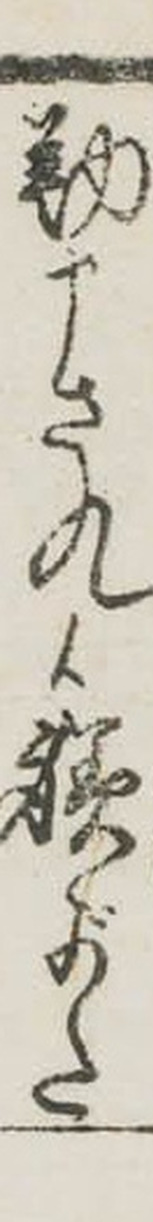勤申され候躾がた
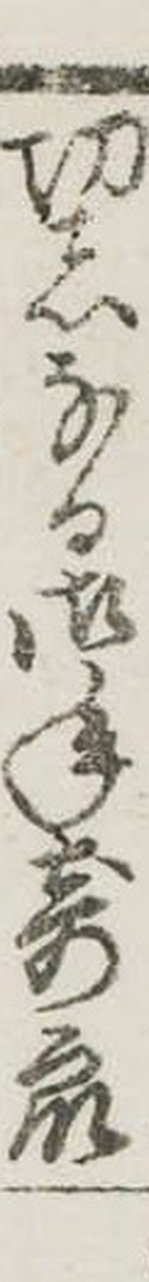功者なる御年寄衆
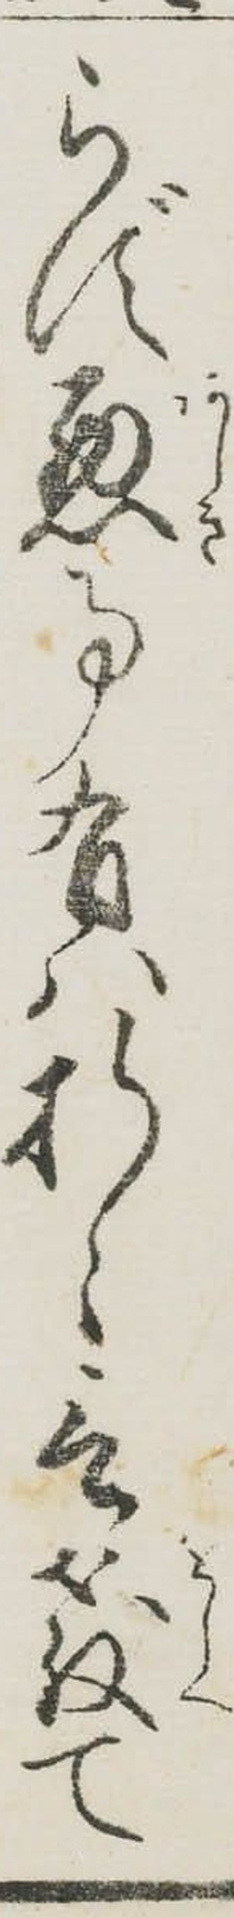らず悪事有は折々言教て
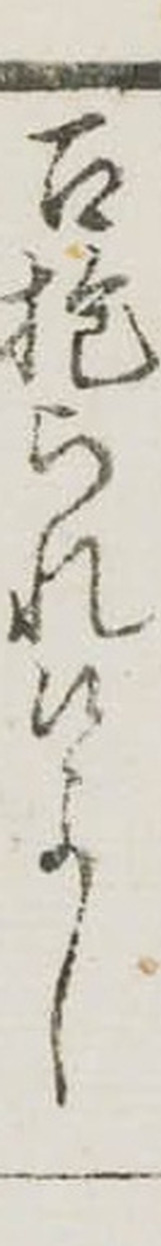召抱られ候よし
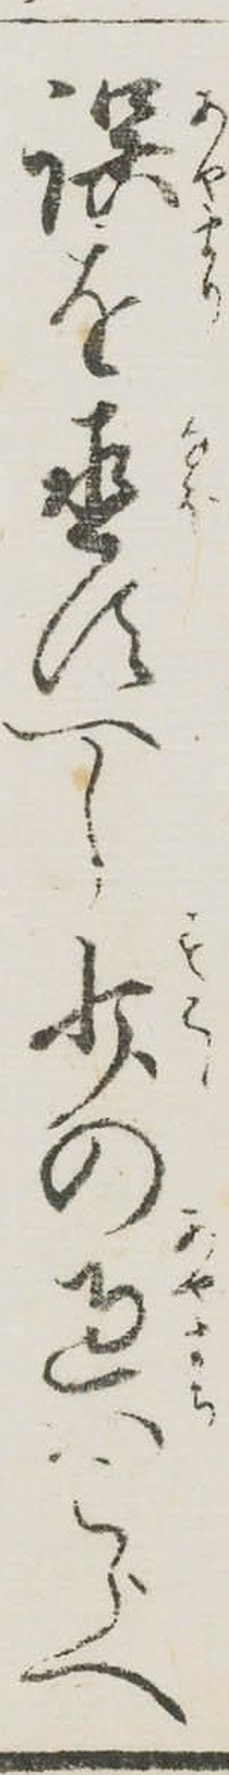誤を直すへし少の過はこらへ
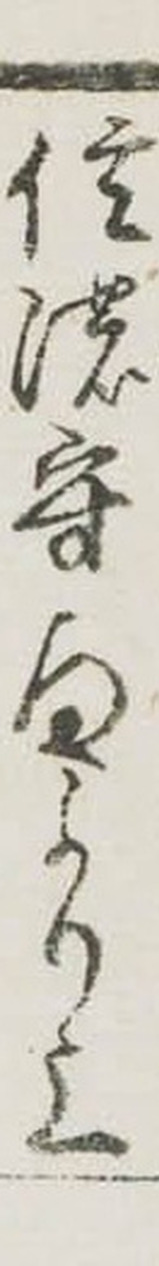信濃守さまより上
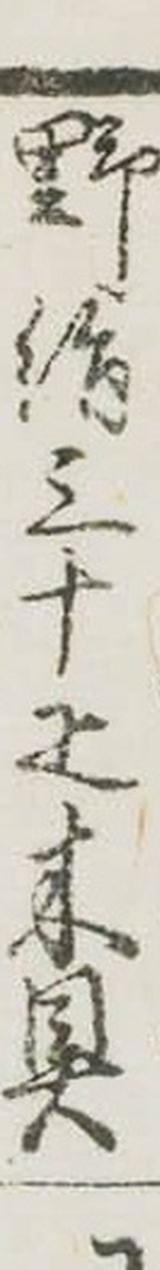野絹三十疋木具
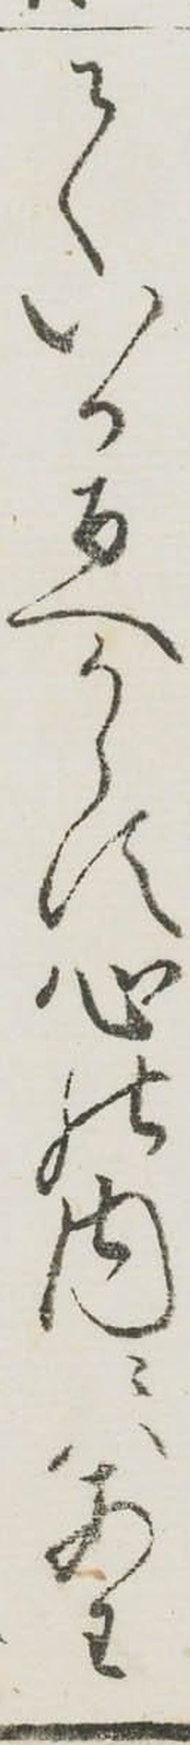ていかるへからす心の内はあわ
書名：女大学
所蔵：東京学芸大学教育コンテンツアーカイブ
